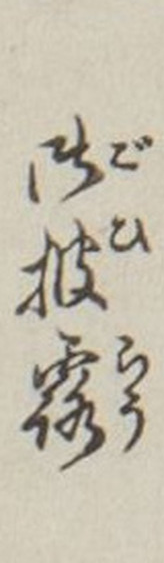御披露
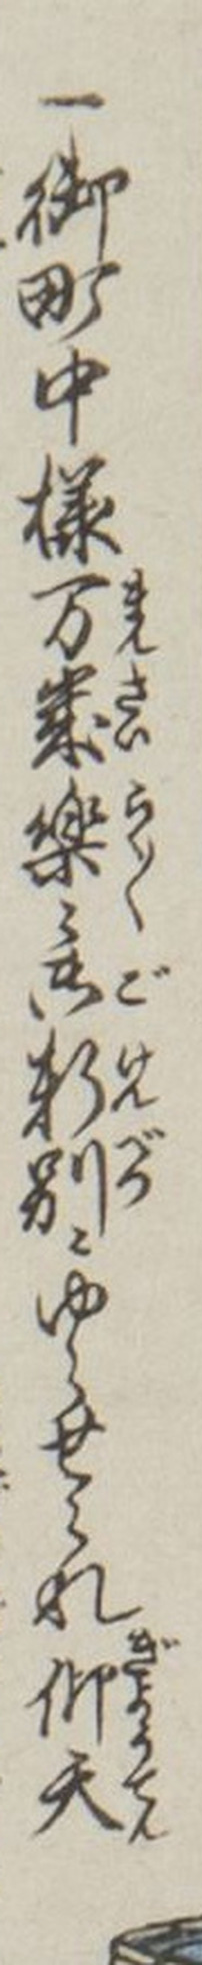一御町中様万歳楽々御軒別にゆらせられ仰天
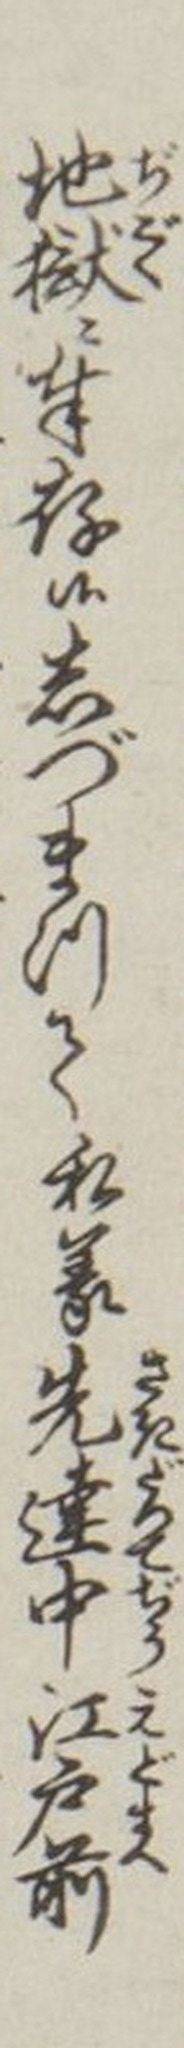地獄に奉存候しづまつて私義先達中江戸前
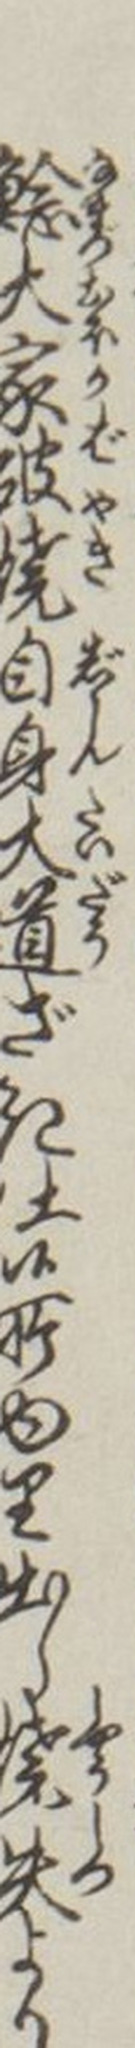鯰大家破焼自身大道ざき仕候所ゆり出し焼失より
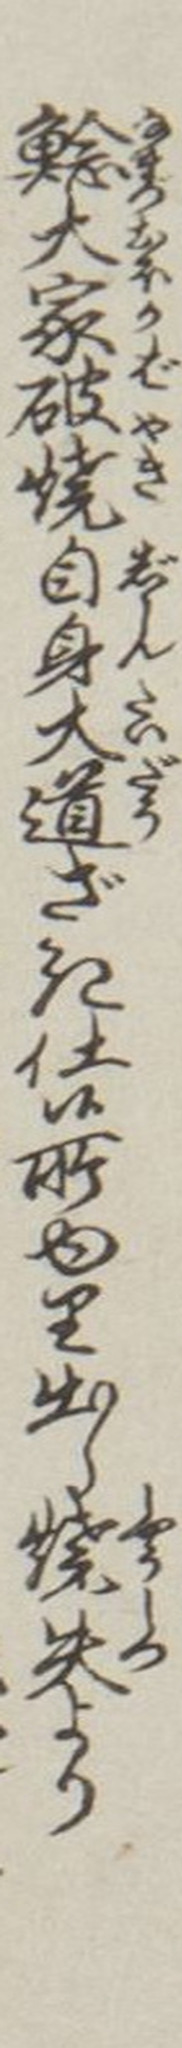鯰大家破焼自身大道ざき仕候所ゆり出し焼失より
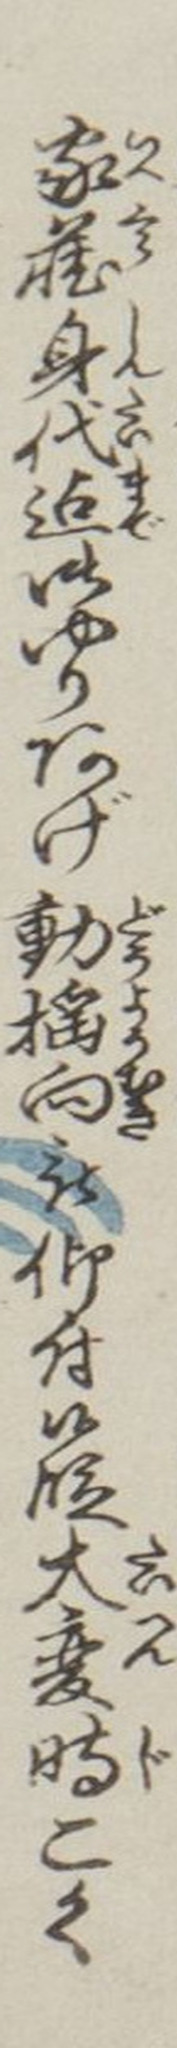家蔵身代迄御ゆりあげ動揺向被仰付候段大変時こく
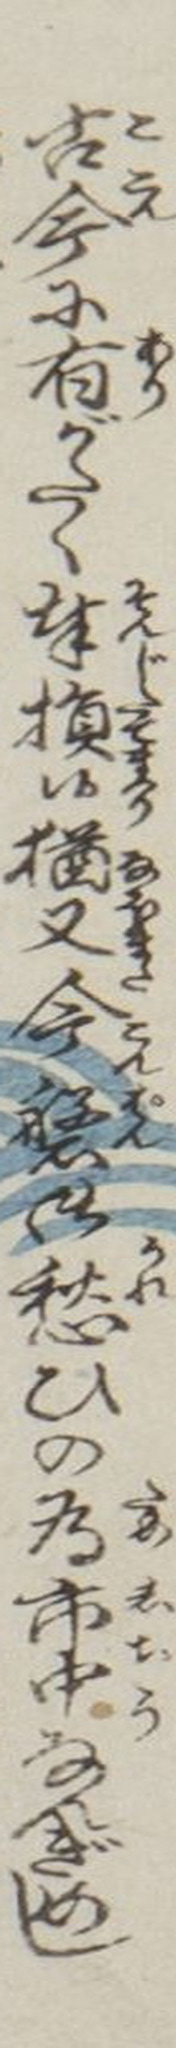古今に有がたく奉損候猶又今磐御愁ひの為市中なんぎめし
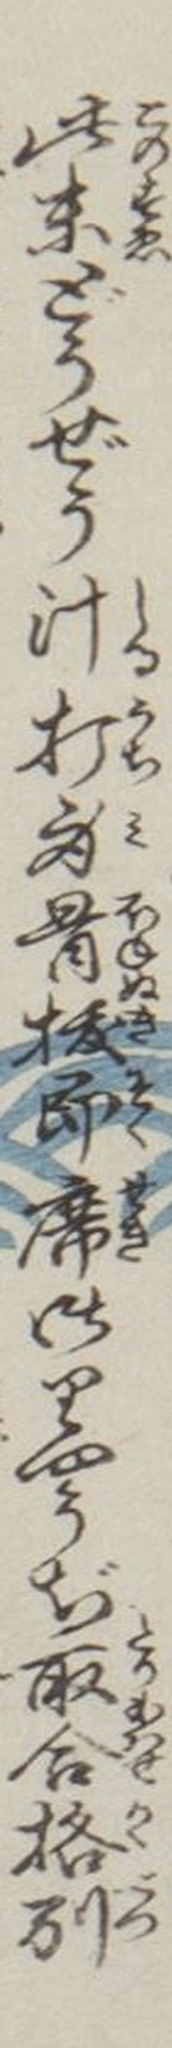此末どうぜう汁打身骨抜即席御りやうぢ取合格別
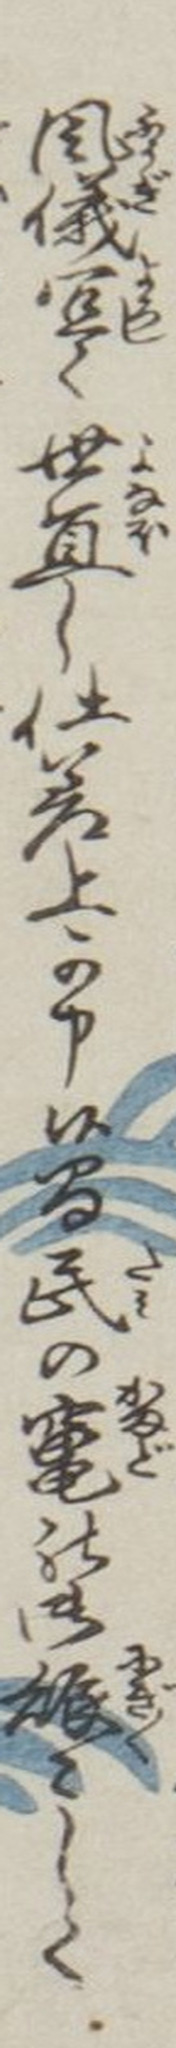風儀宜く世直し仕差上可申候間民の竈の御賑々しく
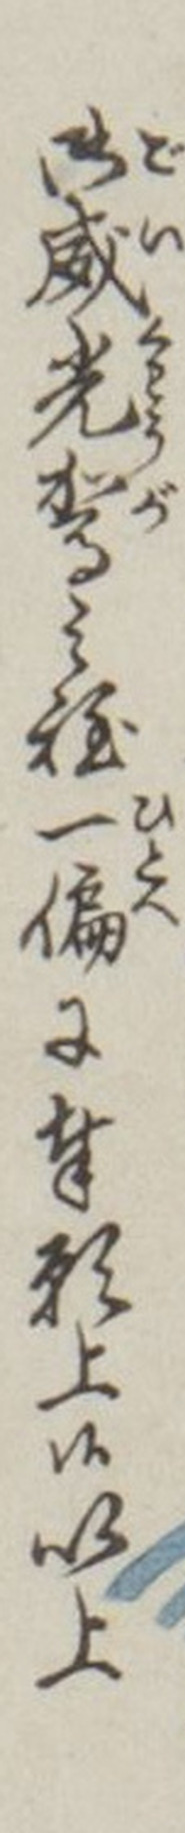御威光駕の程一偏に奉願上候以上
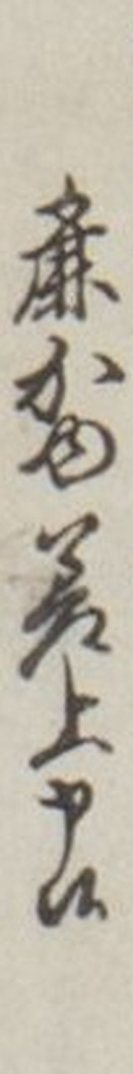麁かゆ差上申候
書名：打身骨抜即席御りやう治
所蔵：あいおいニッセイ同和損保株式会社
